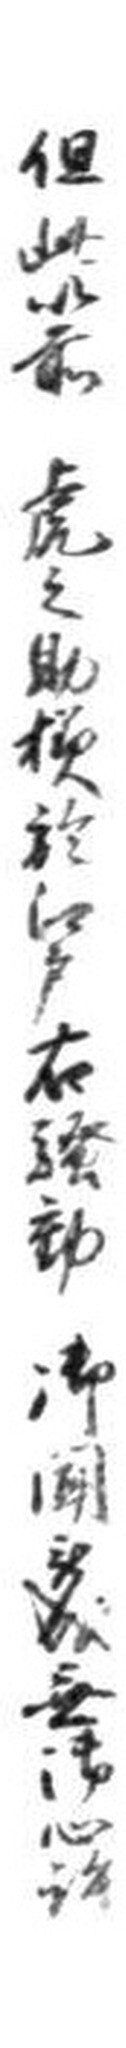但此以前虎之助様於江戸右騒動御聞被成無御心許
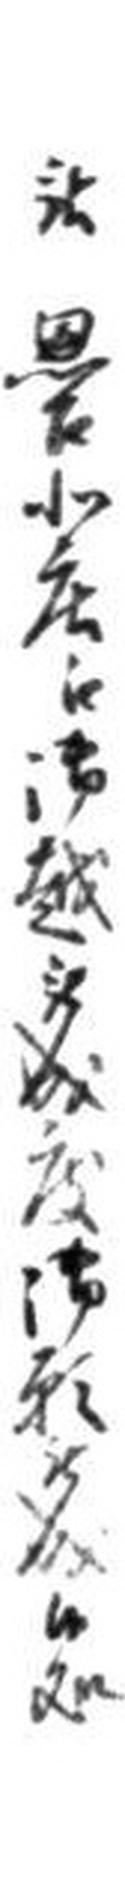被思召北庄江御越被成度御願被成候処
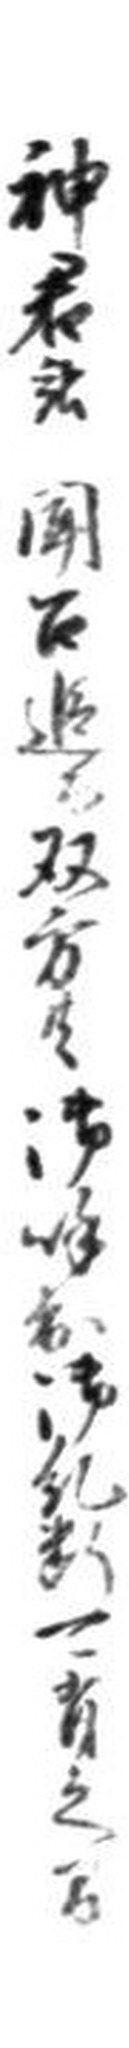神君被聞召追而双方共御呼出御糺断可有之間
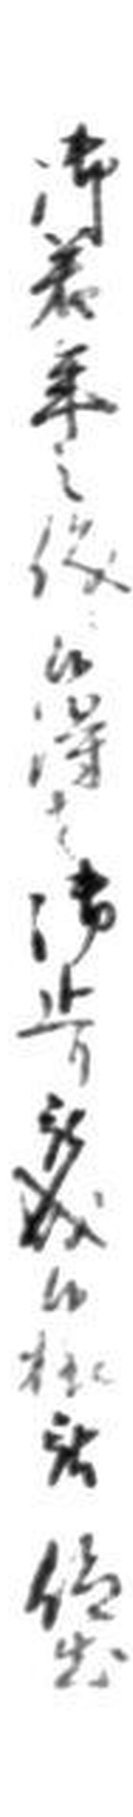御若年之儀候得者御止り被成候様被仰出
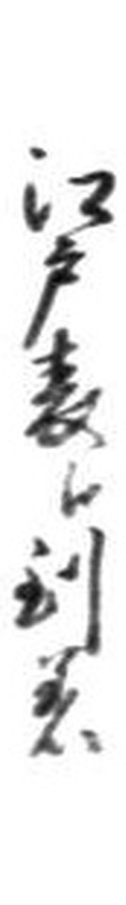江戸表江到着
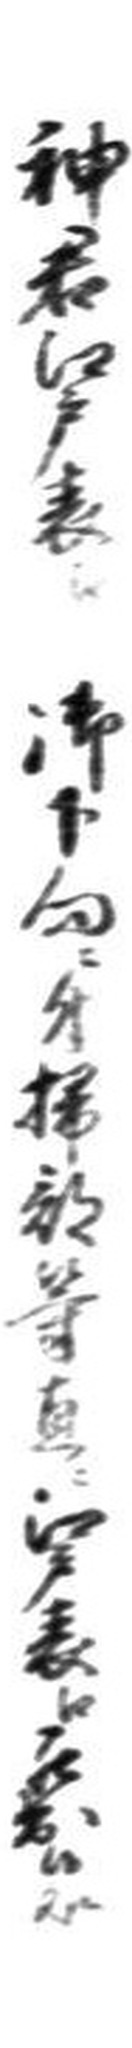神君江戸表江御下向ニ付掃部等直ニ江戸表江罷出候処
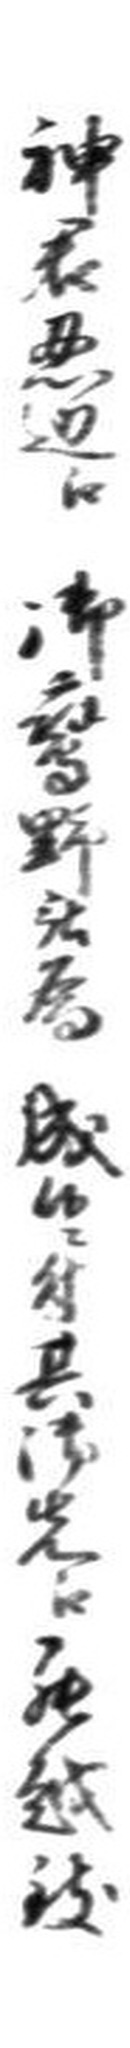神君忍辺江御鷹野被為成候ニ付其御先江罷越致
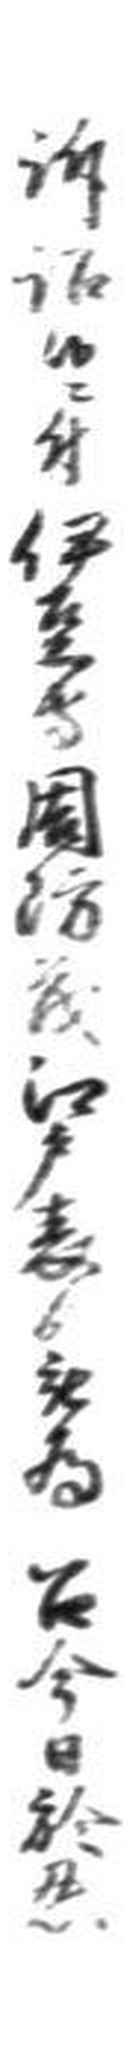訴訟候ニ付伊豆守周防茂江戸表ゟ被為召今日於忍
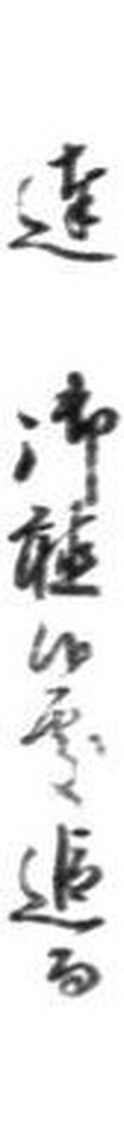達御聴候処追而

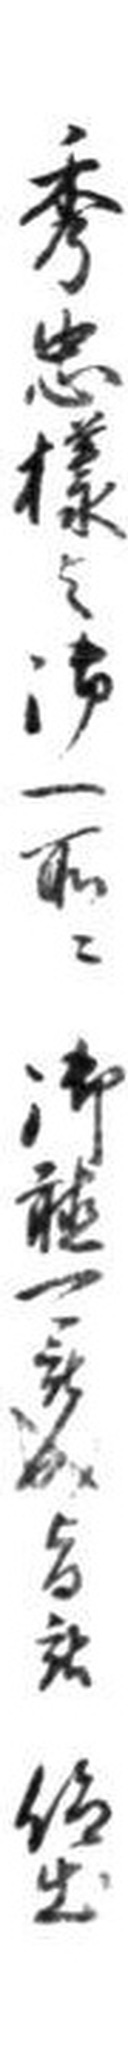秀忠様与御一所ニ御聴可被成旨被仰出
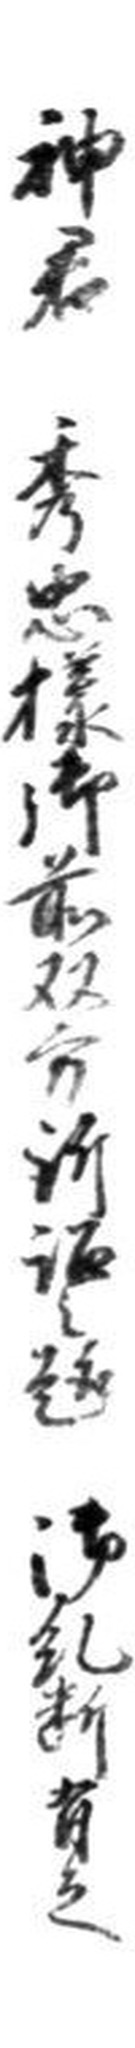神君秀忠様御前双方訴訟之趣御糺断有之
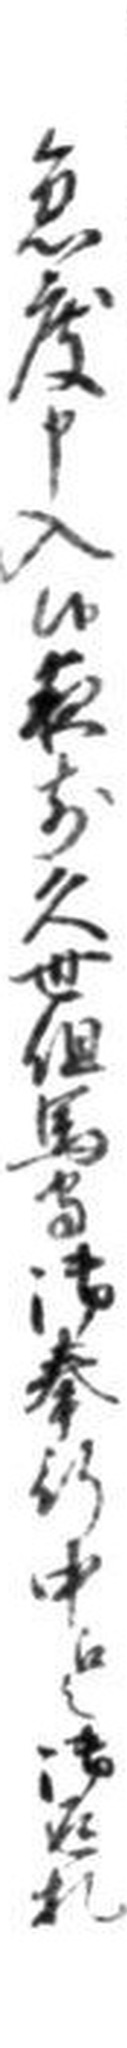急度申入候夜前久世但馬守御奉行中江之御返札
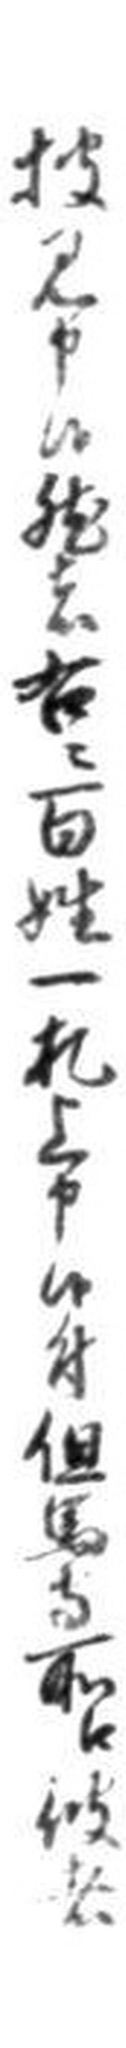披見申候然者右ニ百姓一札上申候付但馬守所江彼者
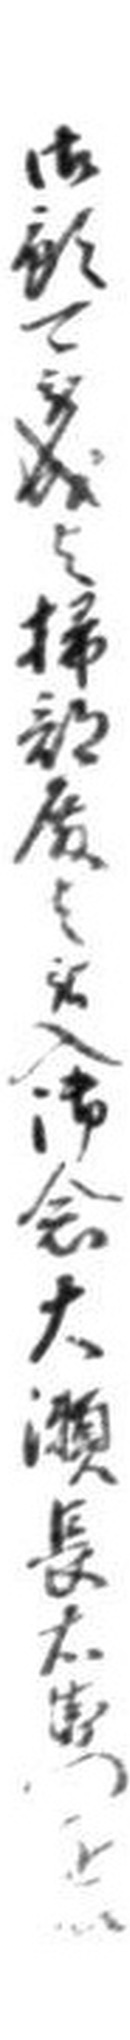御預可被成与掃部殿与被入御念大瀬長右衛門を以
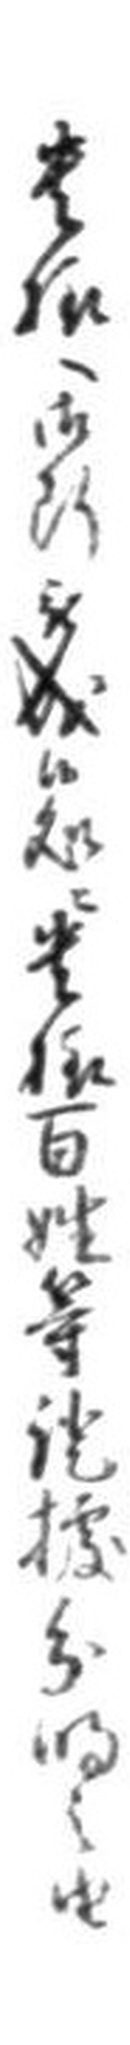貴様へ御断被成候処ニ貴様百姓等証拠分明之由
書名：家譜 二 忠直公 従文禄四年到慶安四年
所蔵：福井県文書館 Fukui Prefectural Archives
